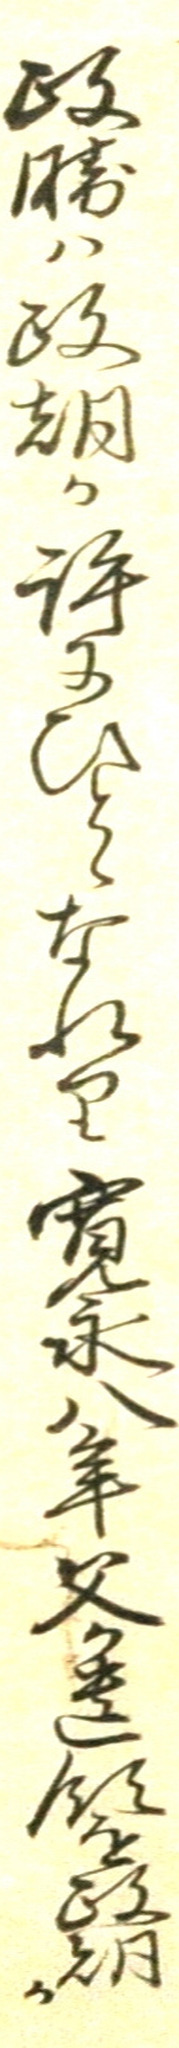政勝は政朝か許にひとゝなれり寛永八年父か遺領を政朝か
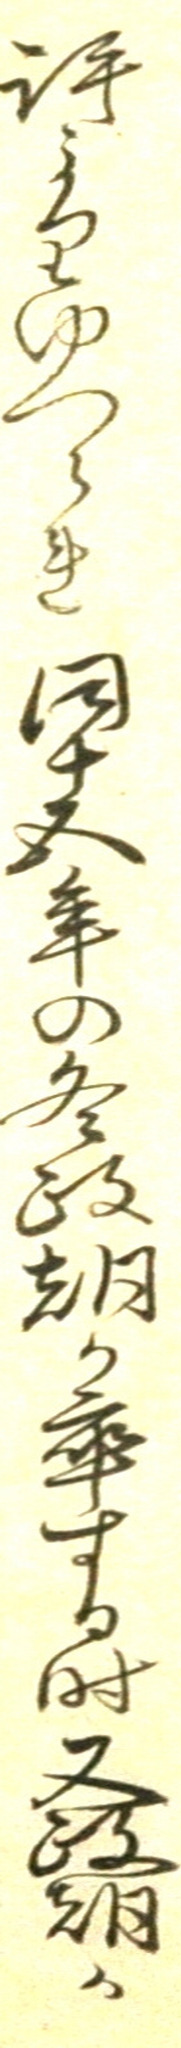許よりゆつられ同十五年の冬政朝か卒する時又政朝か
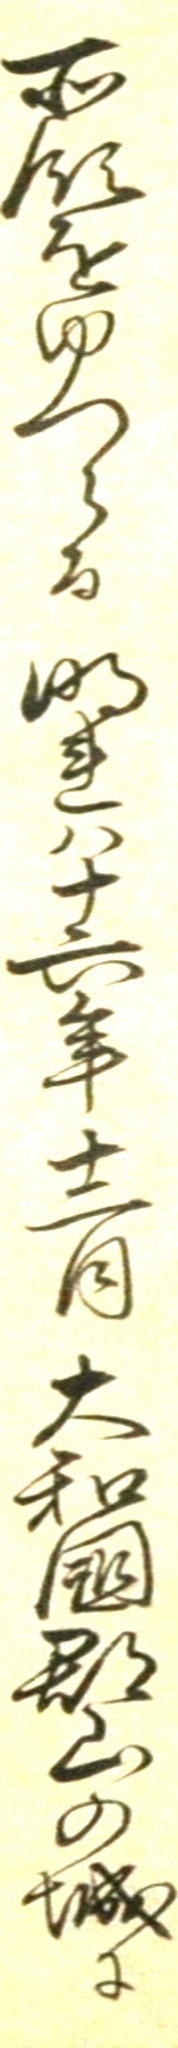所領をゆつらる明れは十六年十二月大和国郡山の城に

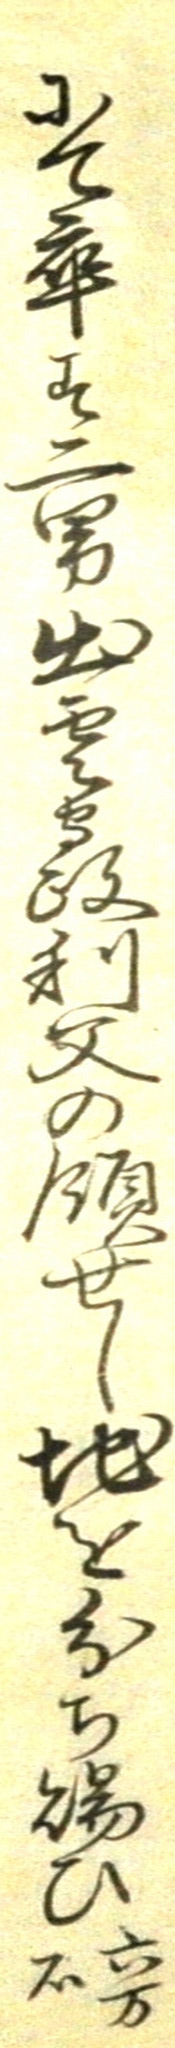にて卒す二男出雲守正利父の領せし地を分ち賜ひ六万石
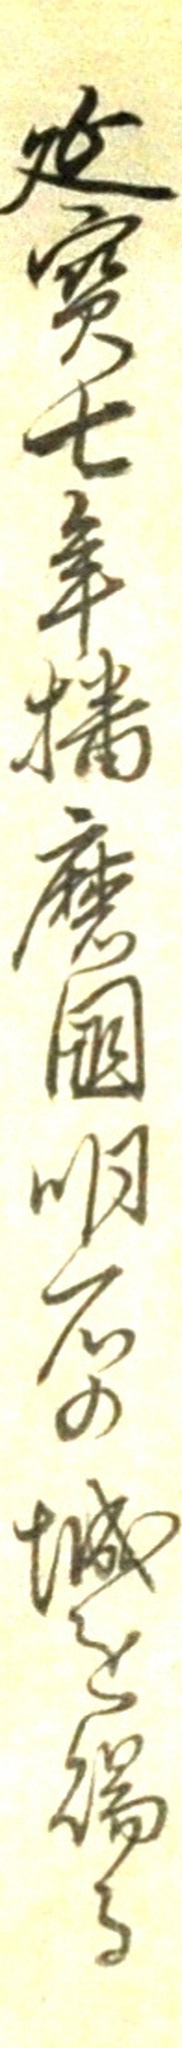延宝七年播磨国明石の城を賜る
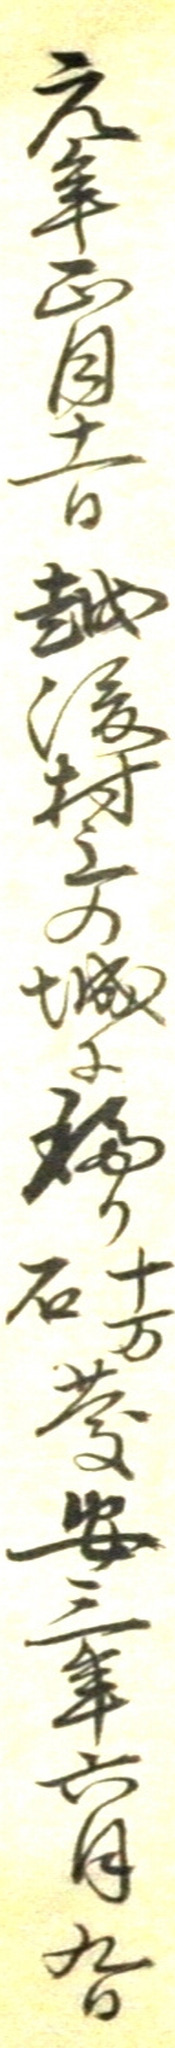元年正月十一日越後村上の城に移り十万石慶安三年六月九日
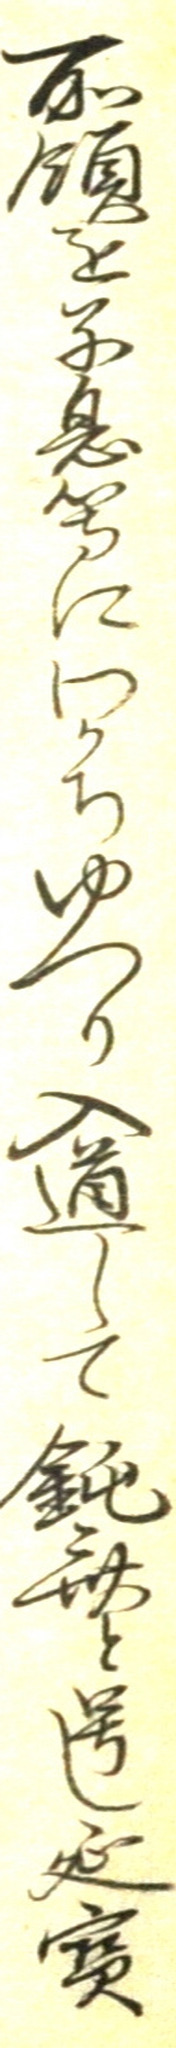所領を子息等にわかちゆつり入道して鈍斎と号し延宝
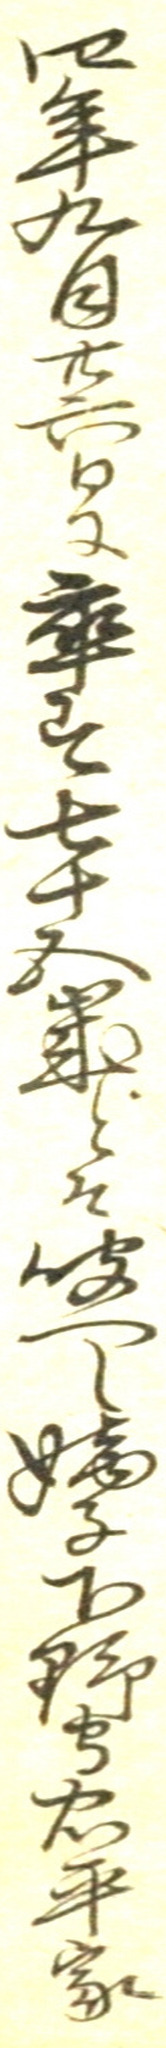四年九月廿六日に卒す七十五歳とそ聞へし嫡子下野守忠平家
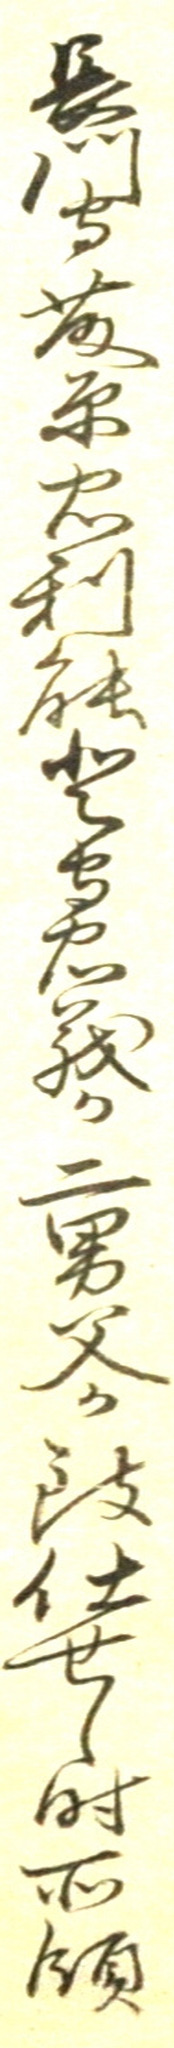長門守藤原忠利能登守忠義か二男父か致仕せし時所領
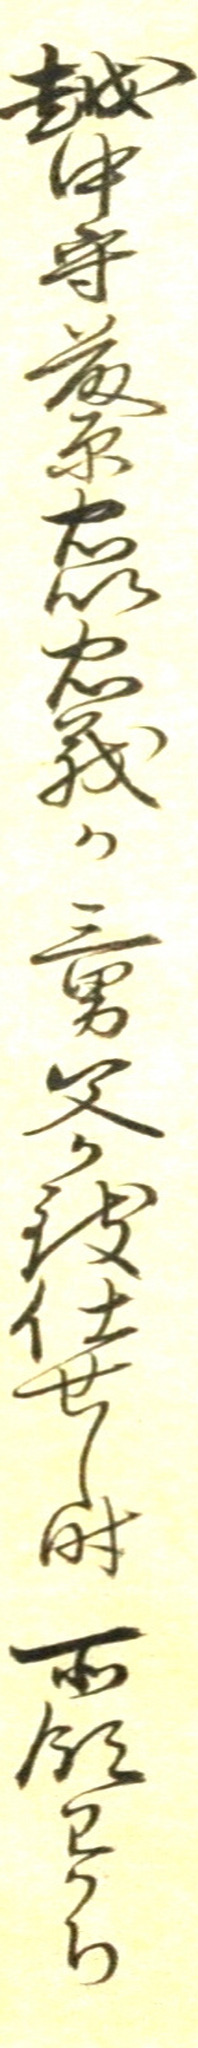越中守藤原忠以忠義か三男父か致仕せし時所領わかち
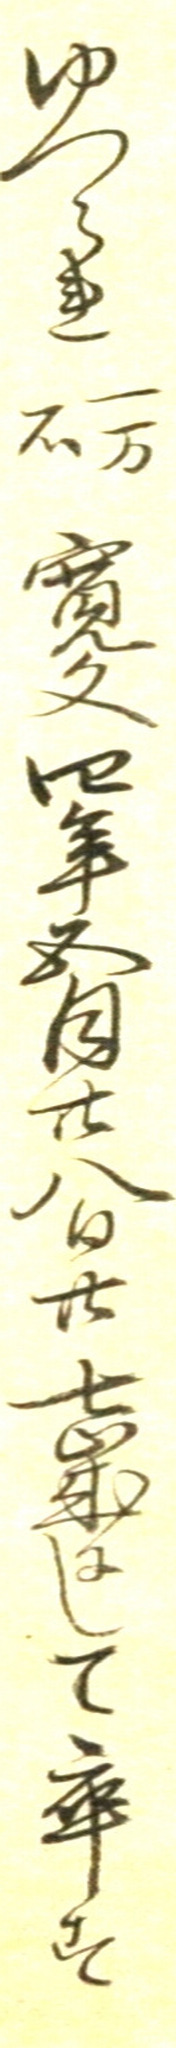ゆつられ一万石寛文四年五月廿八日廿七歳にして卒す
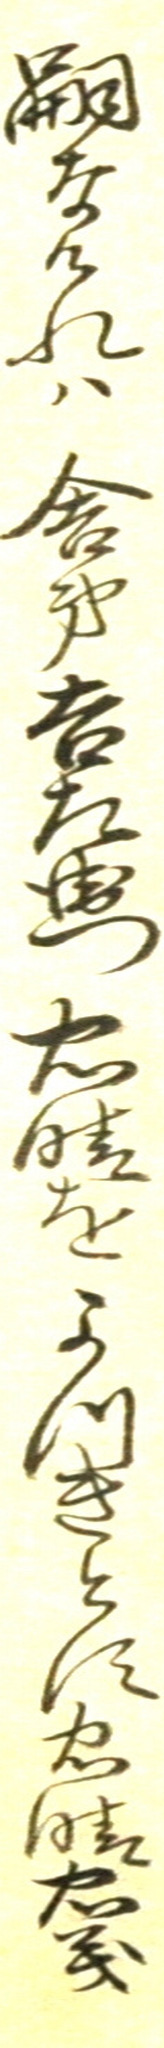嗣なけれは舎弟吉左衛門忠晴をよつきとす忠晴忠義
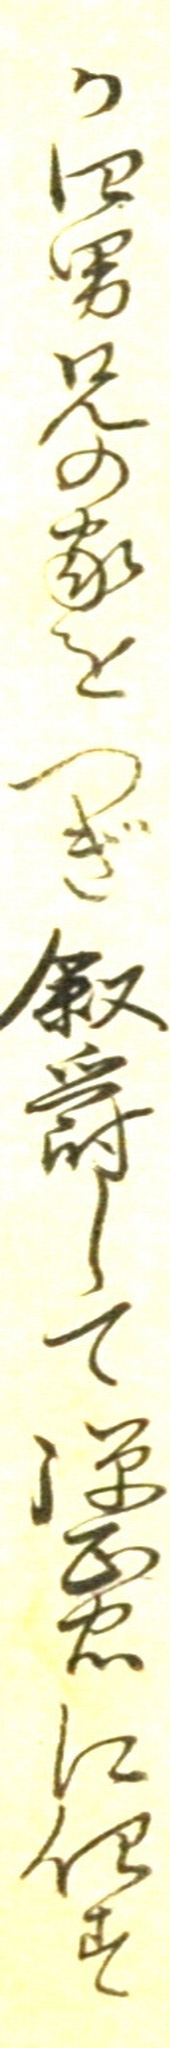か四男兄の家をつぎ叙爵して弾正君に任す

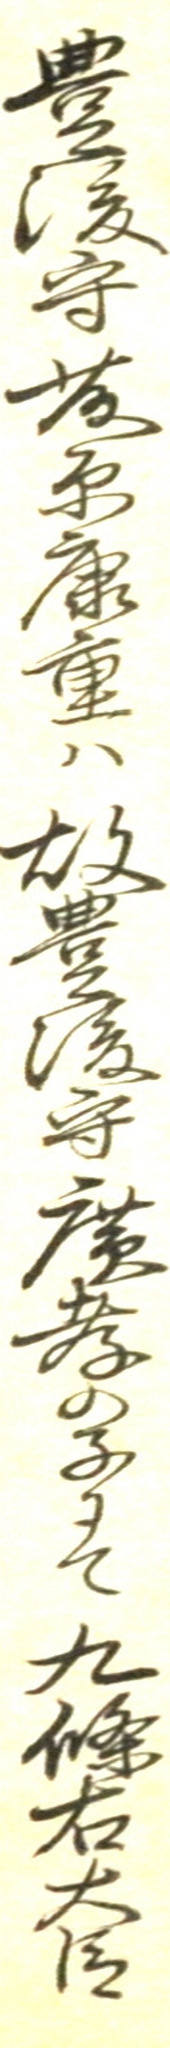豊後守藤原康重は故豊後守廣孝の子にて九条右大臣
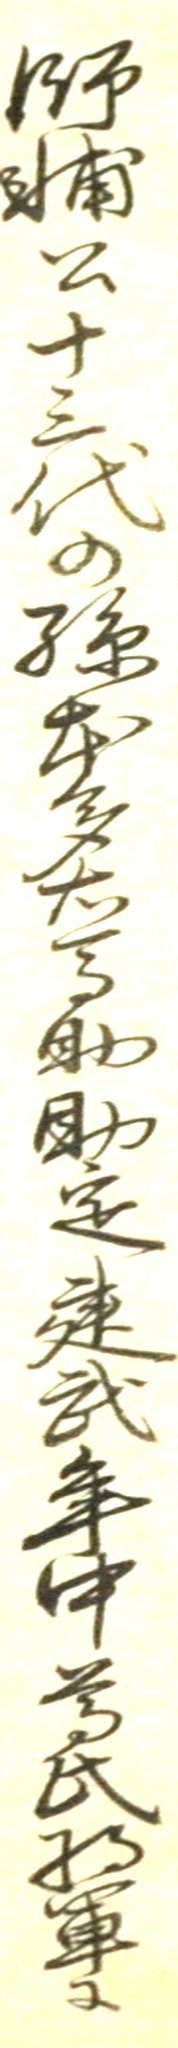師輔公十三代の孫本多右馬助助定建武年中尊氏将軍に
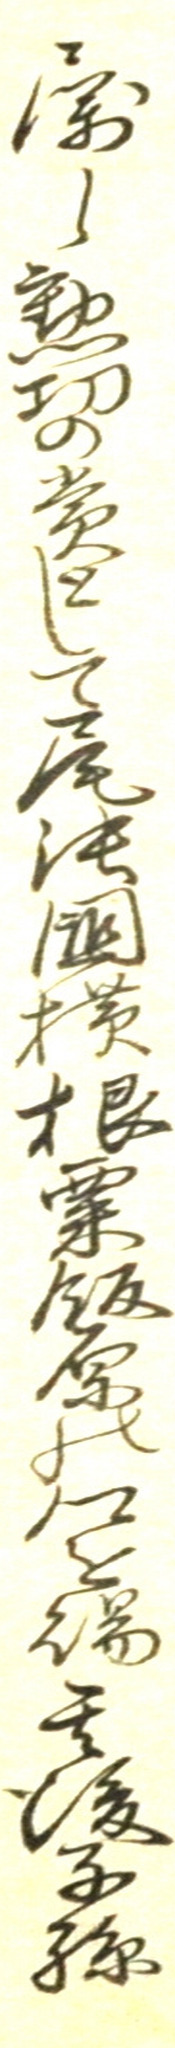属し勲功の賞として尾張国横根粟飯原の郷を賜其後子孫
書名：藩翰譜（四・上）
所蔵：伊那市立高遠町図書館・合同会社AMANE
